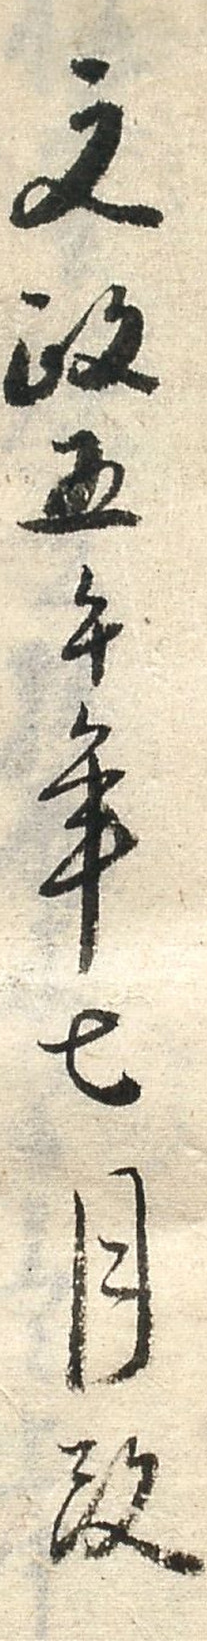文政五午年七月改
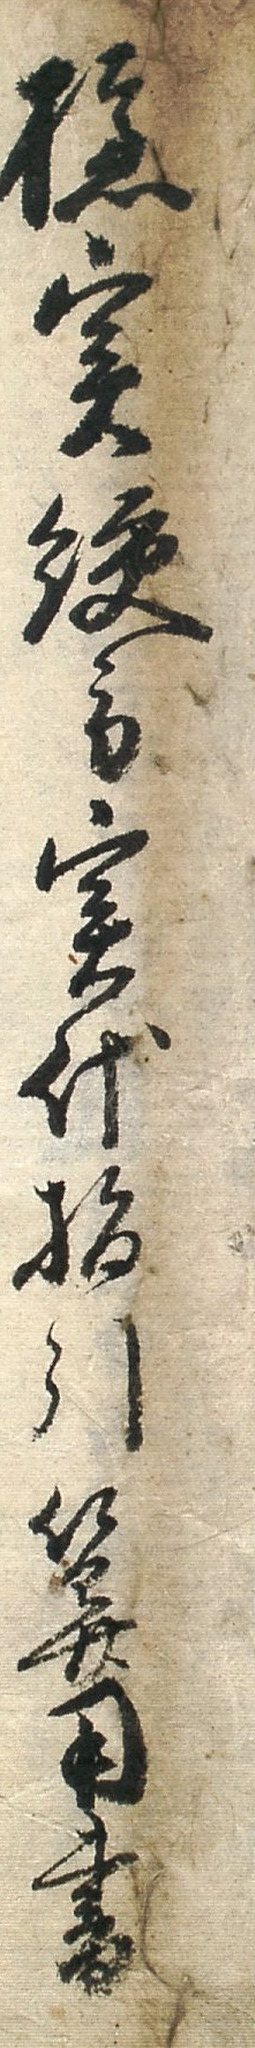櫨実絞方実代指引算用書

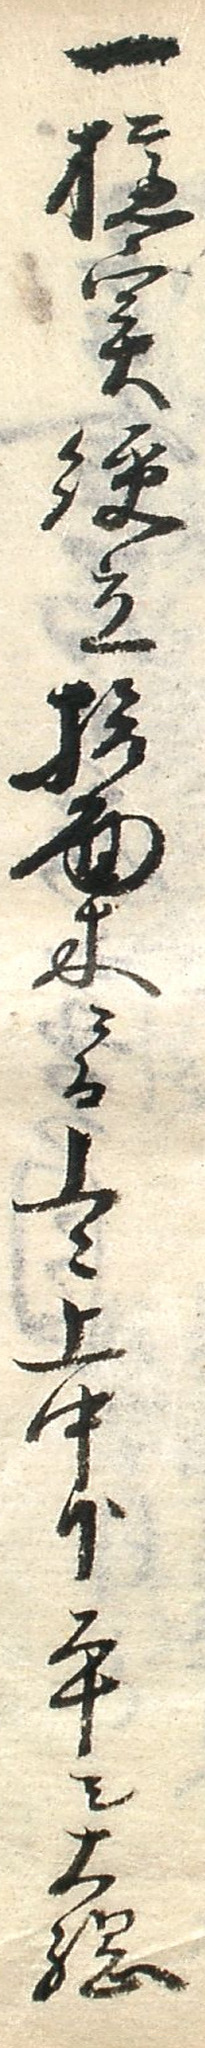一櫨実絞立拾面木にて上々上中下平し大綱
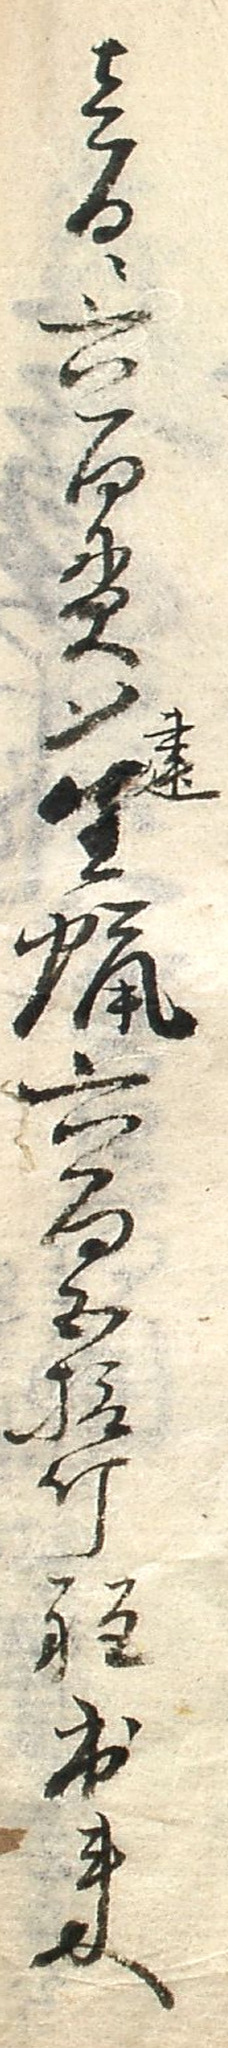壱日に六百貫にして建生蝋六百五拾斤程到来
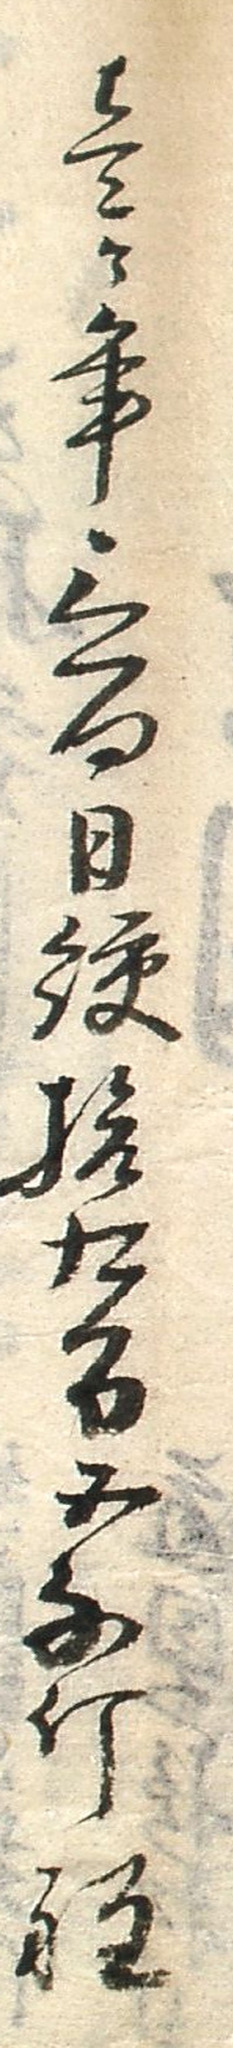壱ヶ年三百日絞拾九万五千斤程
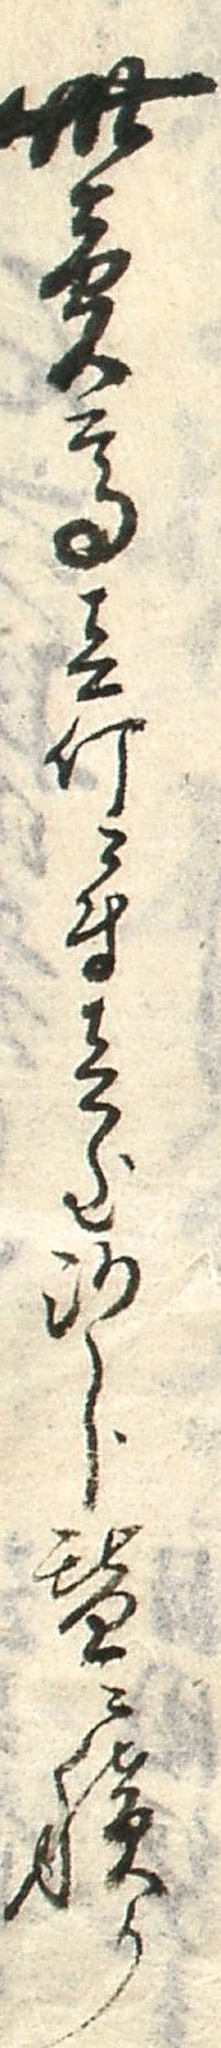此売高壱斤に付壱匁弐分替に積り
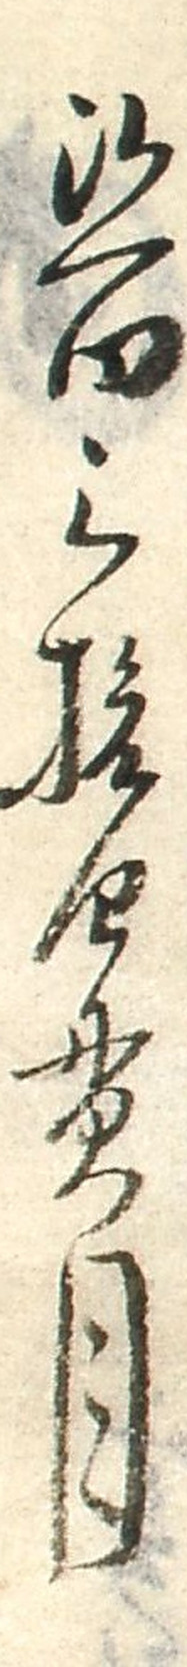弐百三拾四貫目

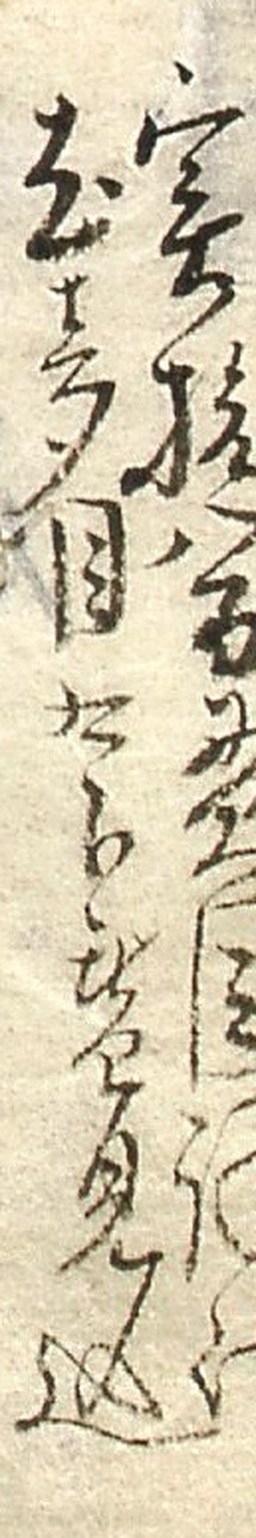尤壱目九分替見込
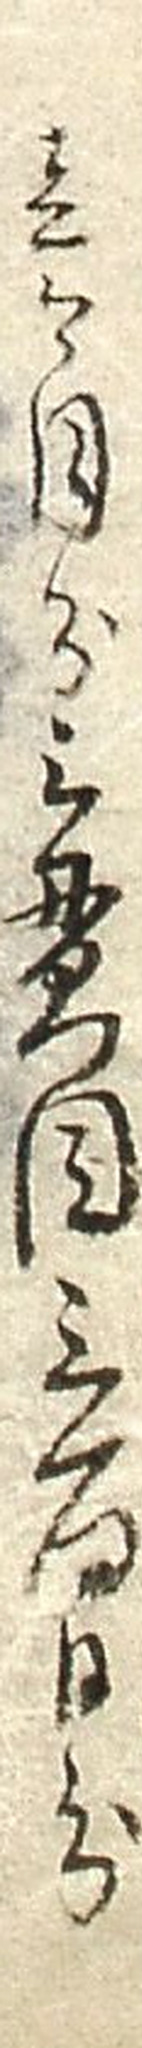壱ヶ月分三貫目三百日分
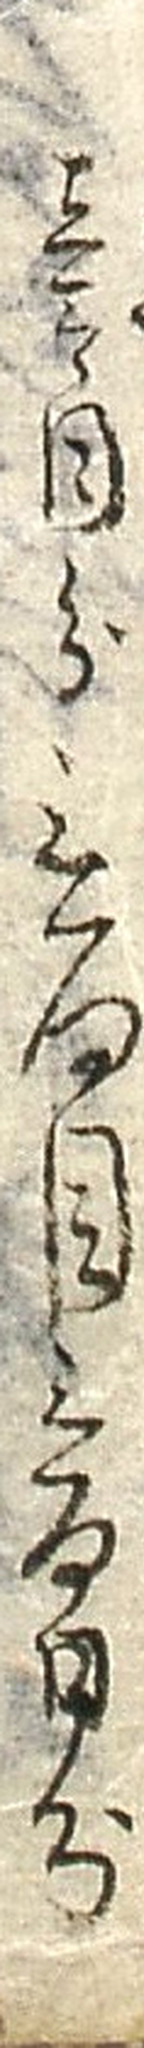壱ヶ月分三貫目三百日分
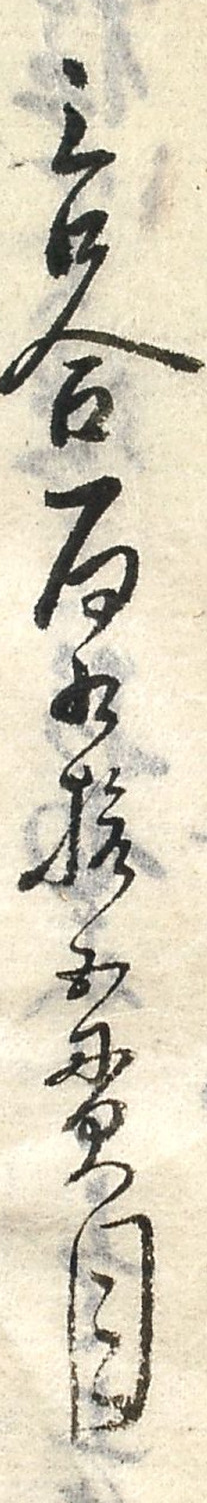三口合百九拾五貫目
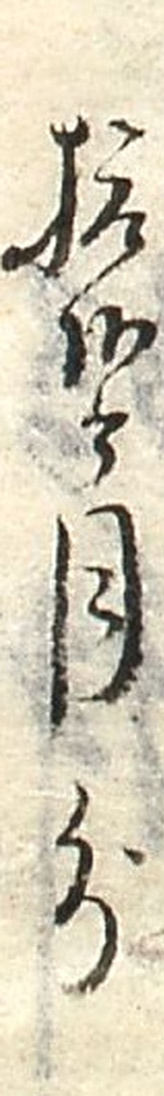拾弐ヶ月分
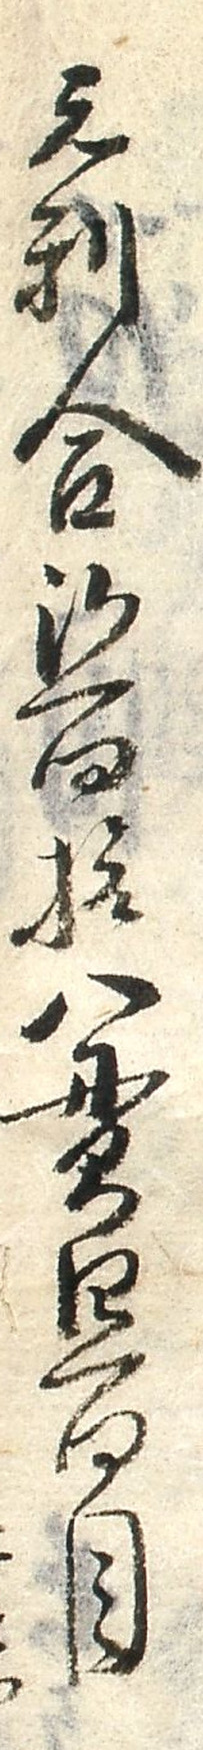元利合弐百拾八貫四百目
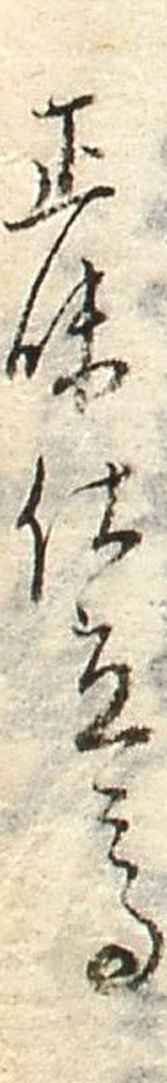正味仕立高
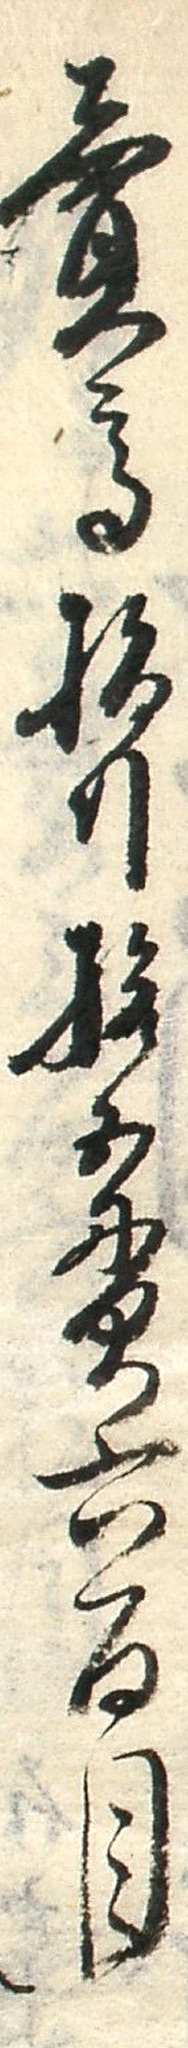売高指引拾五貫六百目

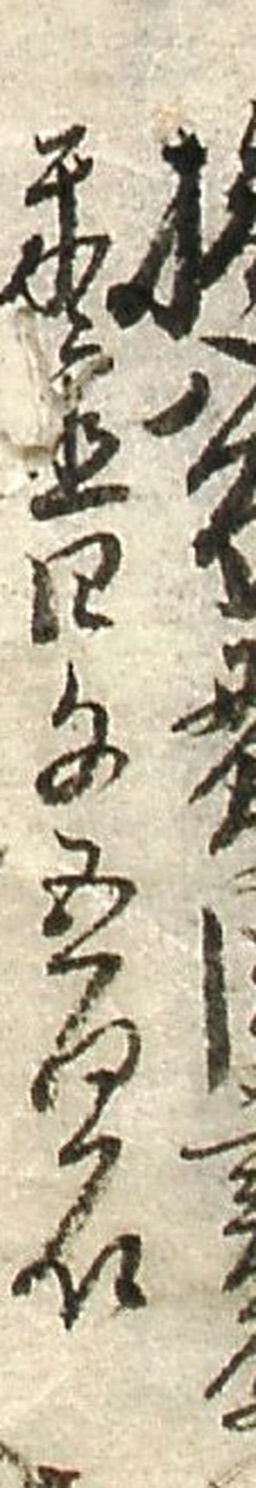米に直四千五百石
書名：櫨実絞方実代指引算用書
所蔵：鳴門教育大学 Naruto University of Education
